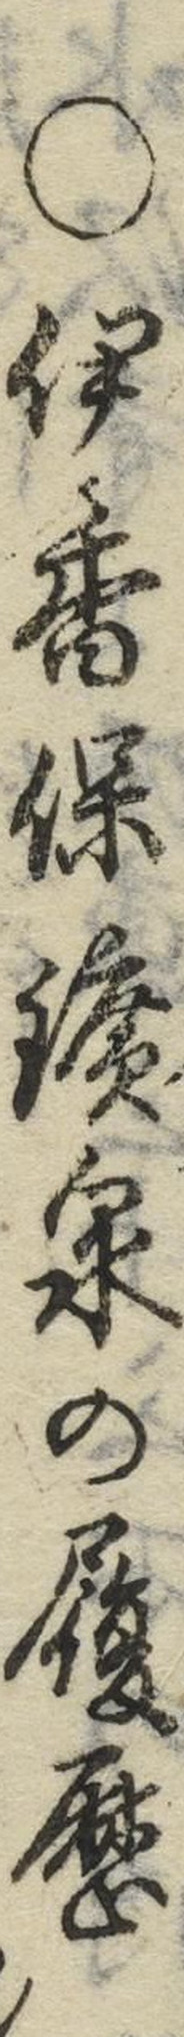○伊香保温泉の履歴
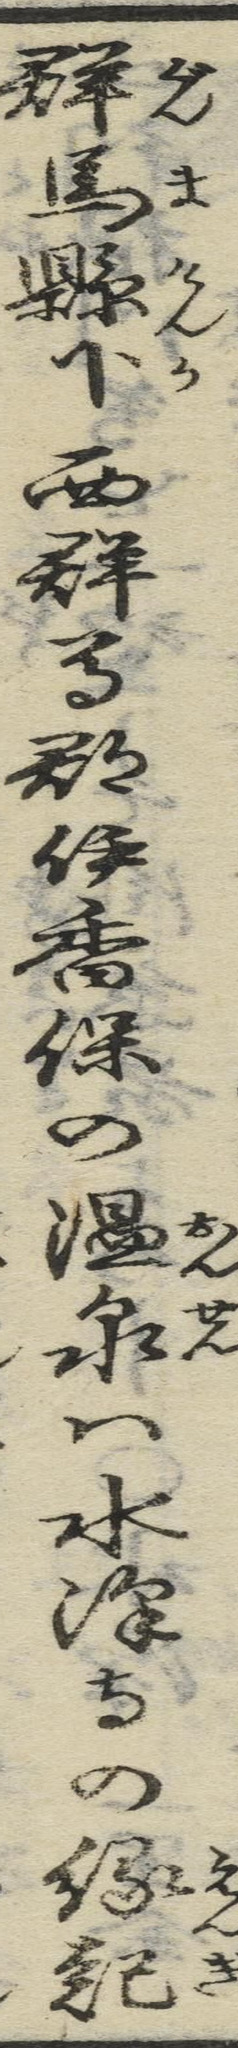群馬縣下西群馬郡伊香保の温泉は水澤寺の縁起
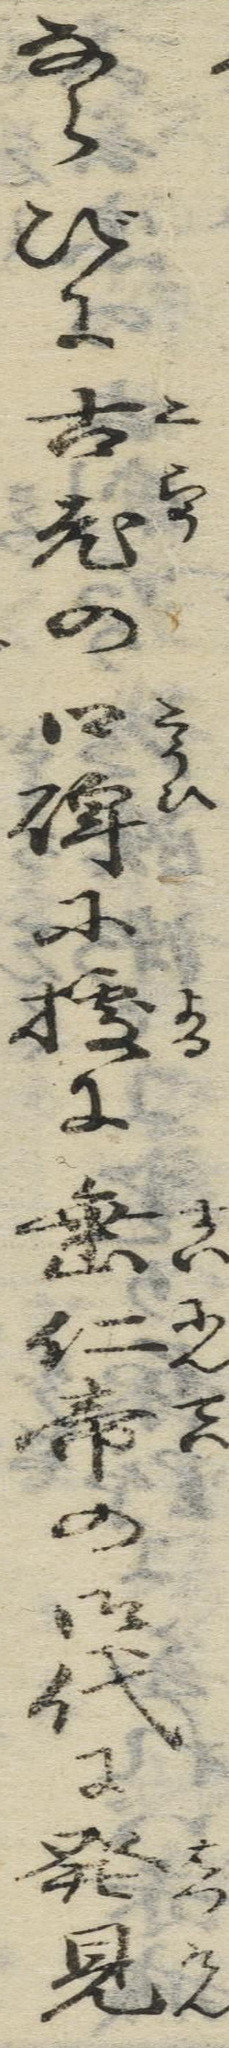ならびに古老の口碑に拠るに垂仁帝の御代に発見
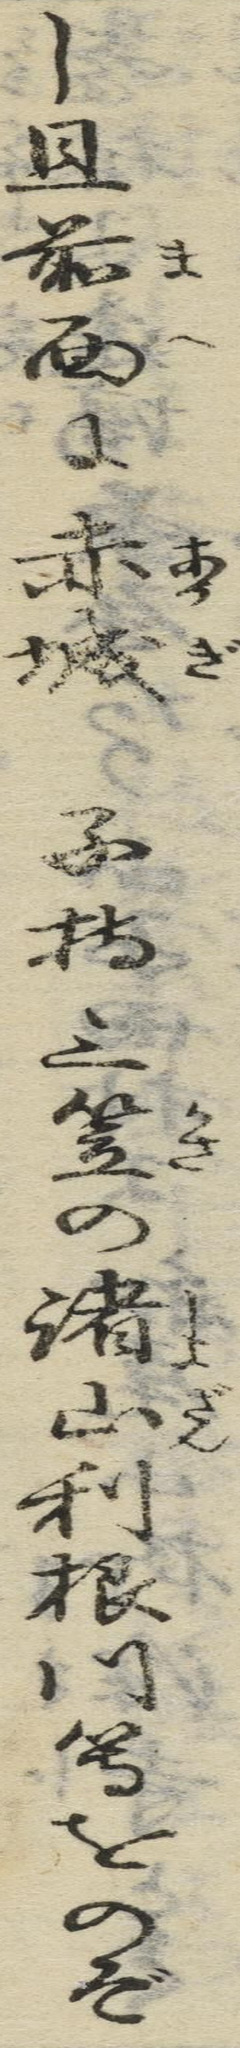し且全面に赤城子持三笠の諸山利根川等をのぞ
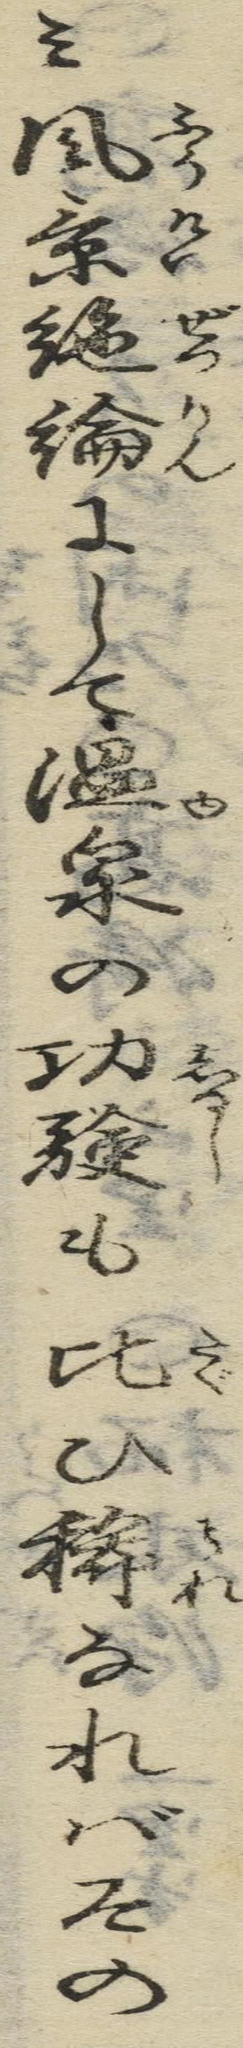み風景絶倫にして温泉の功験も比ひ稀なればその
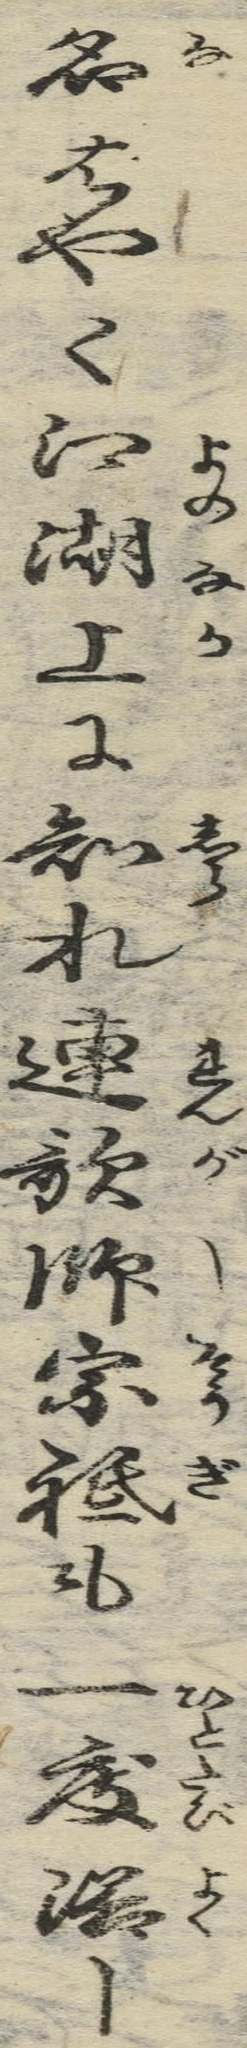名はやく江湖上に知れ連歌師宗祇も一度浴し
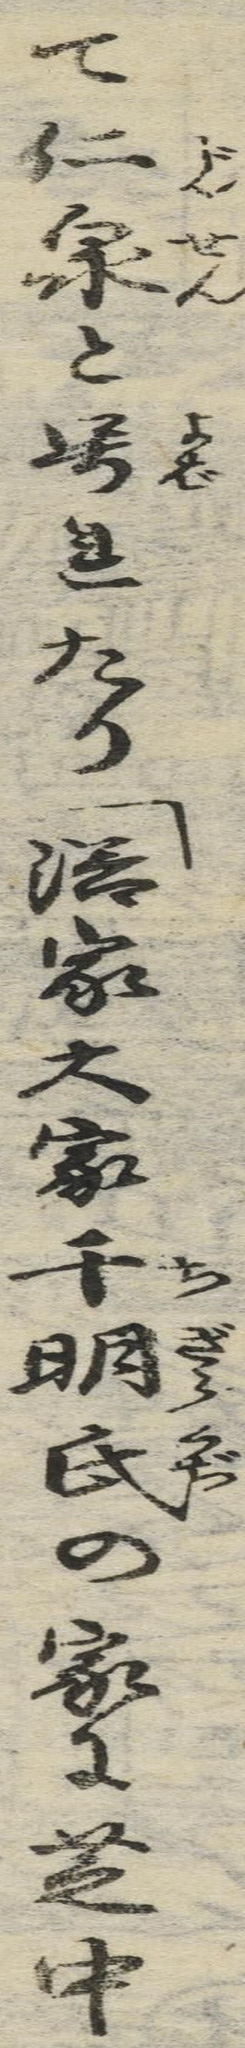て仁泉と号れたり「浴家大家千明氏の家に芝中
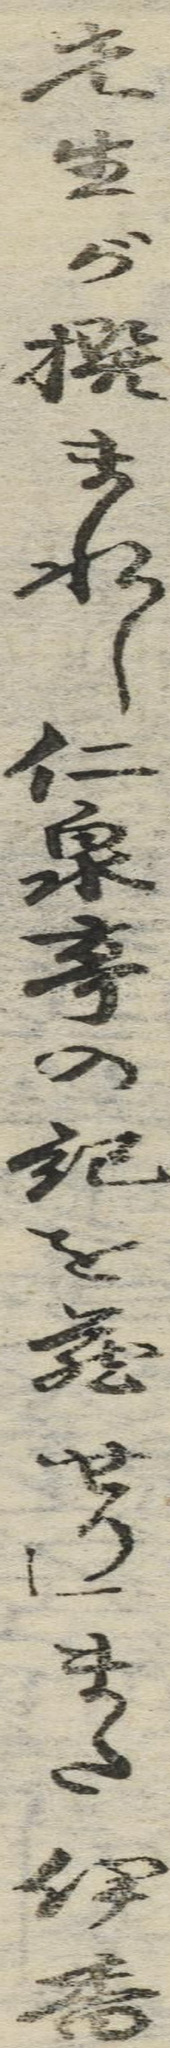先生が撰まれし仁泉亭の記を蔵せり」また伊香
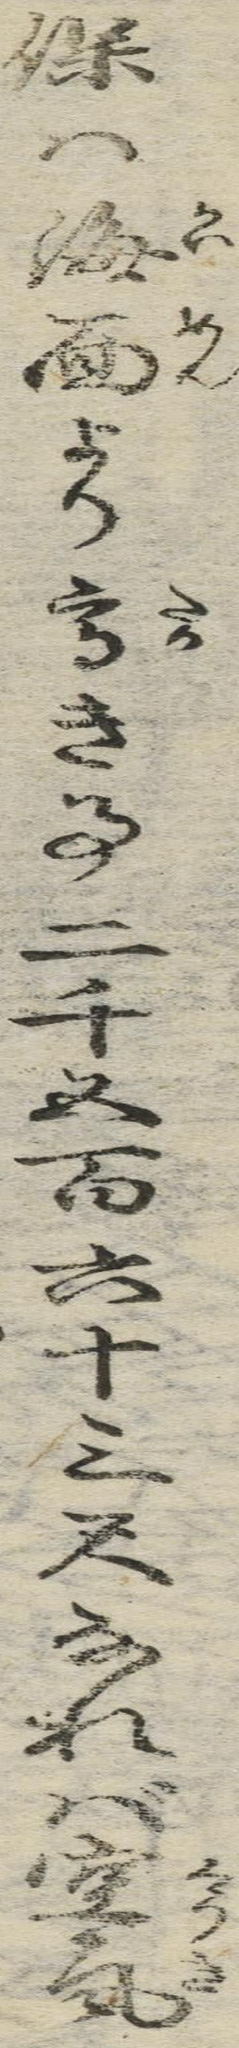保の海面より高き事二千五百六十三尺なれば空気
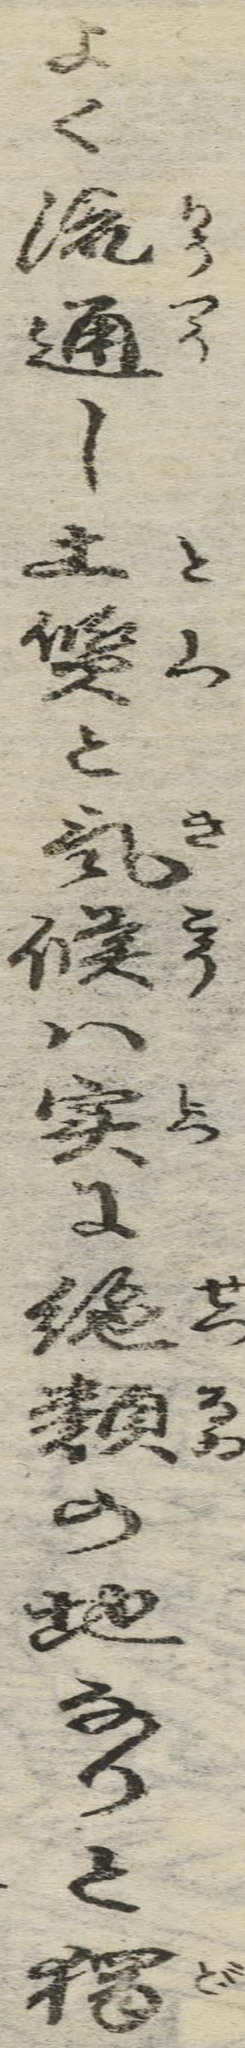よく流通し土質と気候は実に絶類の地なりと獨
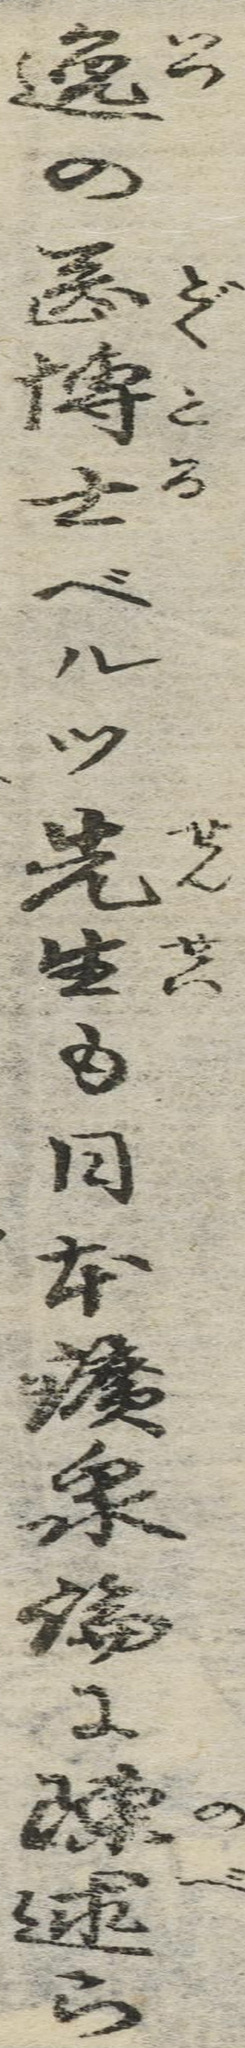逸の医者士ベルツ先生も日本鑛泉論に陳述ら
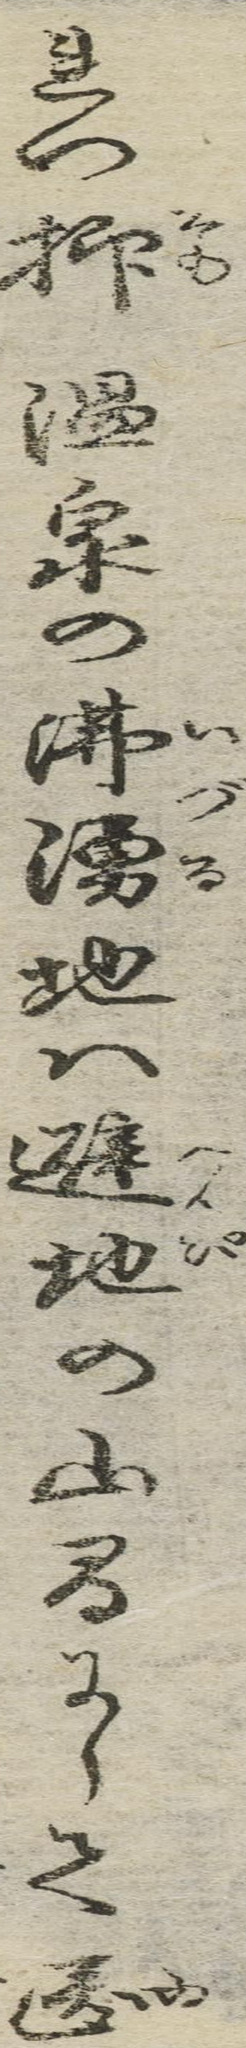れつ抑温泉の沸湧地は避地の山間にして医
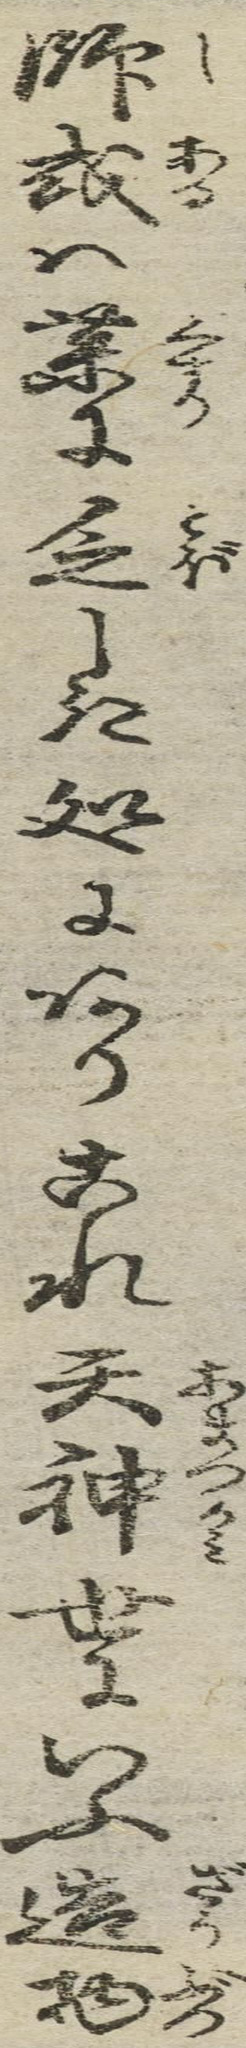師或は薬に乏しき処にありあれ天神世にいふ造物
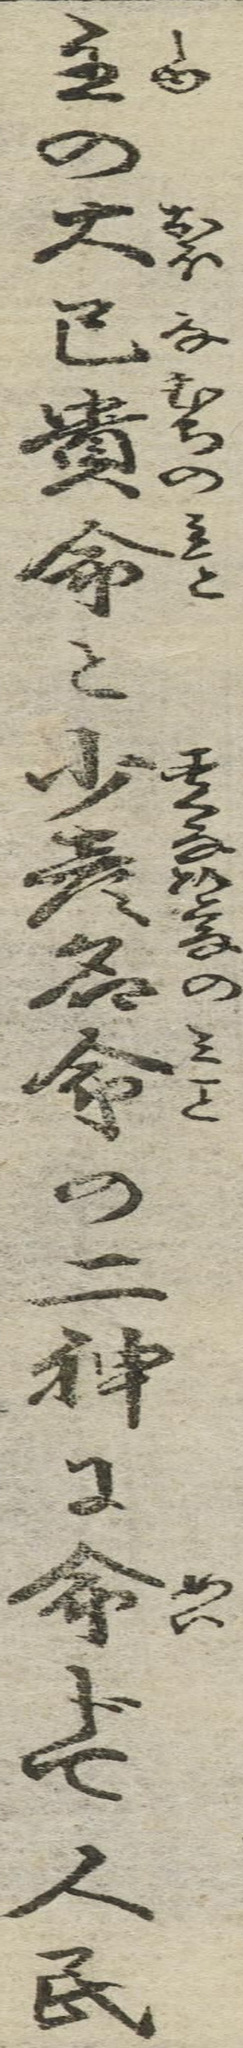主の大名貴命と少彦名命の二神に命じて人民
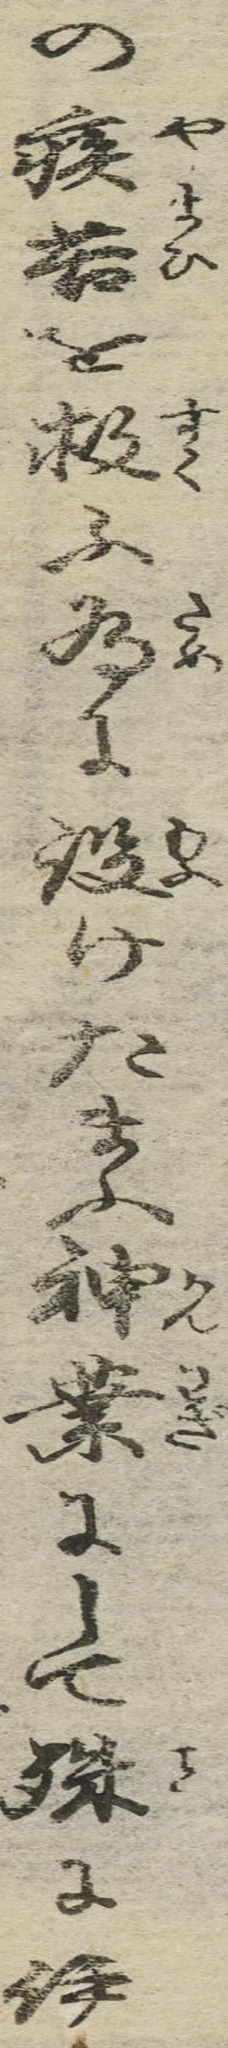の疾苦を救ふ為に設けたまふ神業にして殊に伊
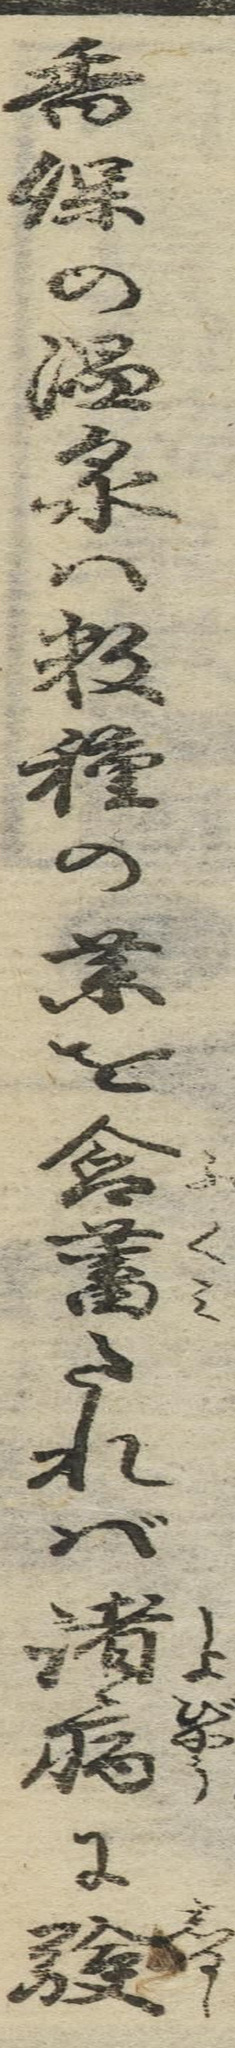香保の温泉は数種の業と含蓄されば諸病に験
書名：上州伊香保鑛泉圖會　全
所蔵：東京大学地震研究所図書室 Earthquake Research Institute Library, The University of Tokyo, JAPAN
